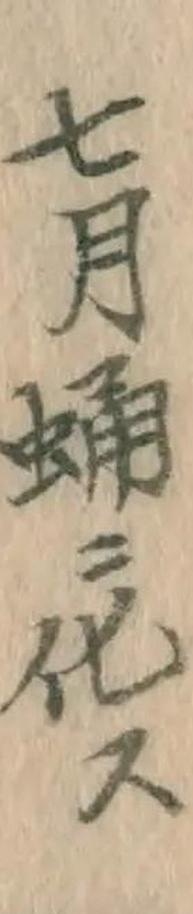七月蛹ニ化ス
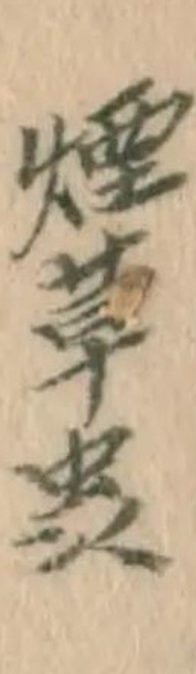煙草蟲
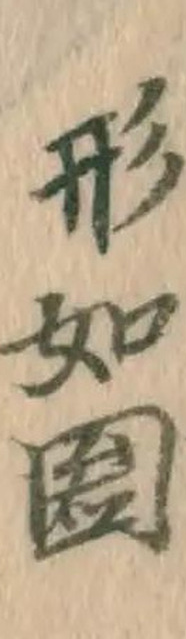形如圖
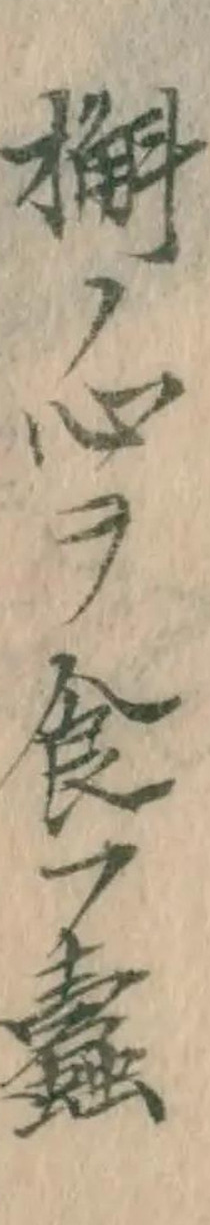槲ノ心ヲ食フ蠹

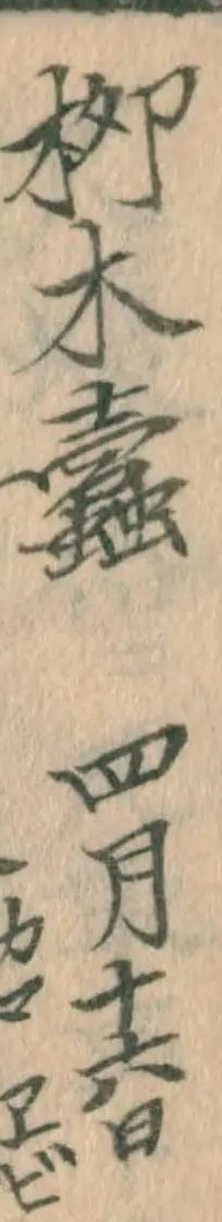栁木蠧四月十六日
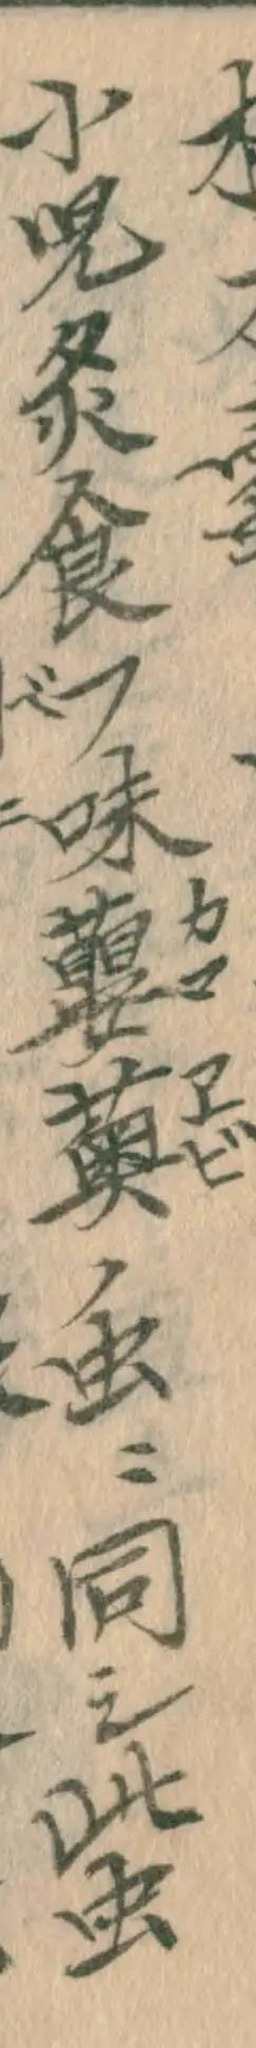小児炙食フ味蘡薁ノ虫ニ同シ此虫
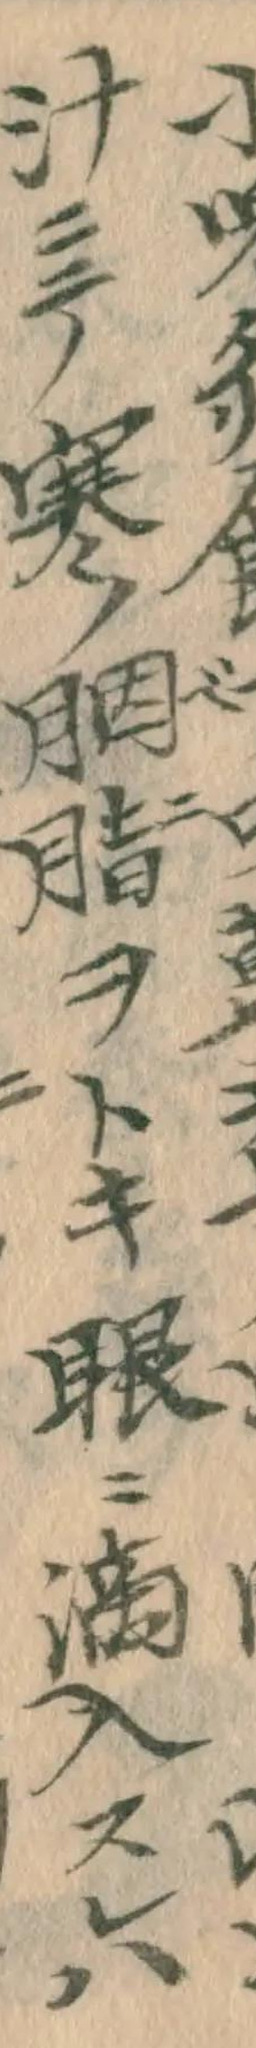汁ニテ寒ノ胭脂ヲトキ眼ニ滴入スレハ
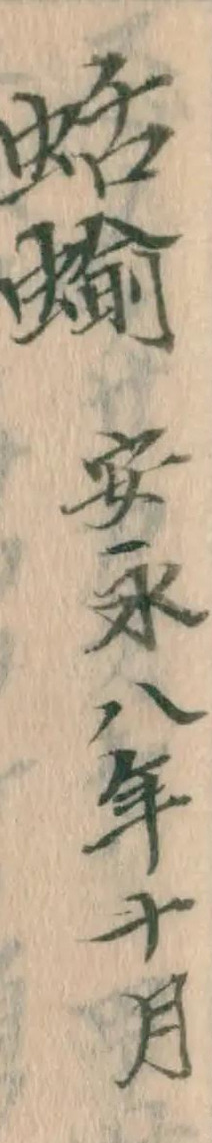蛞蝓安永八年十月
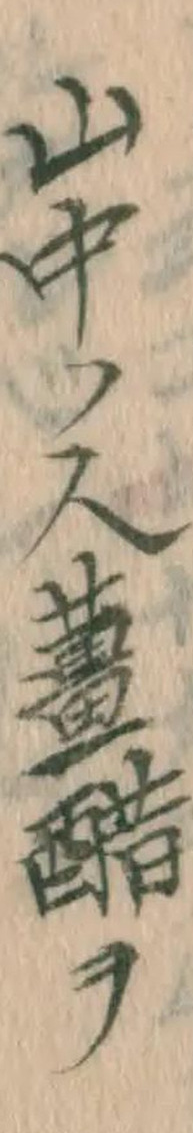山中ノ人薑醋ヲ
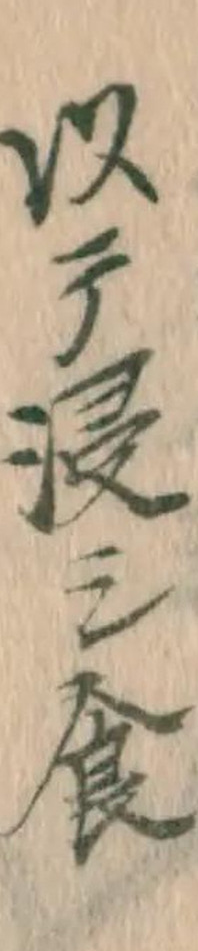以テ浸シ食
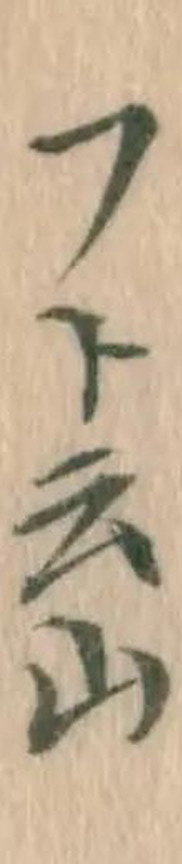フト云山
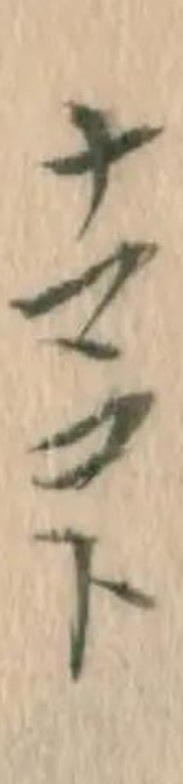ナマコト

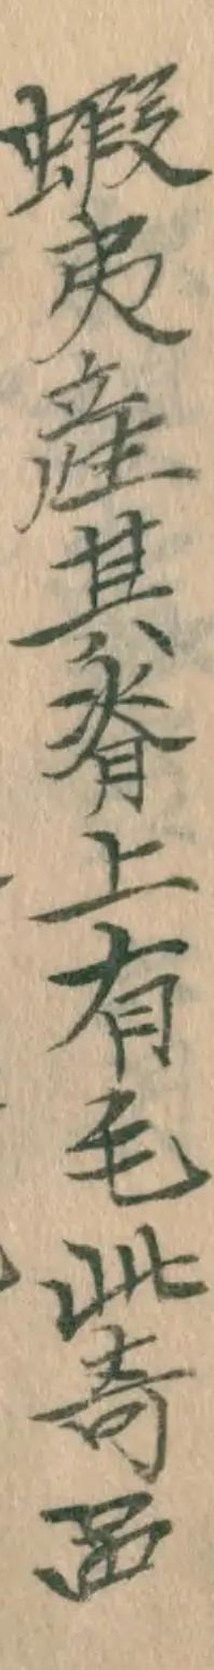蝦夷其脊上有毛此奇品
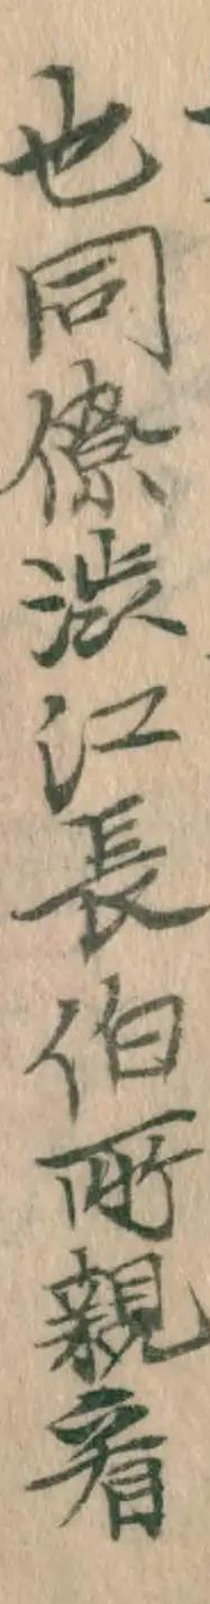也同僚渋江長伯所親看
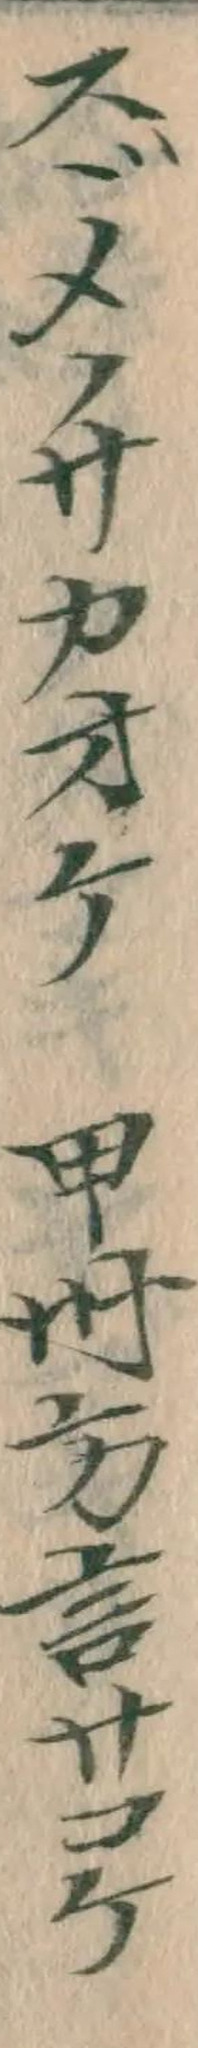スヾメノサカオケ甲州方言サコケ
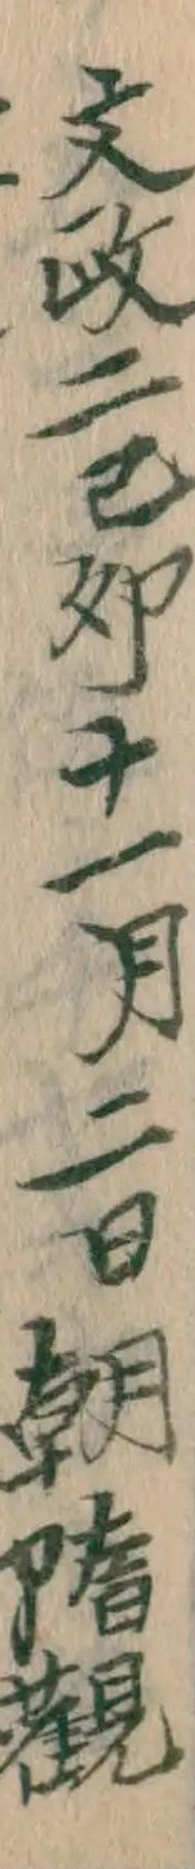文政二己卯十一月二日朝随觀
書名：千蟲譜 3巻. [2]
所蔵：国立国会図書館 National Diet Library, JAPAN
